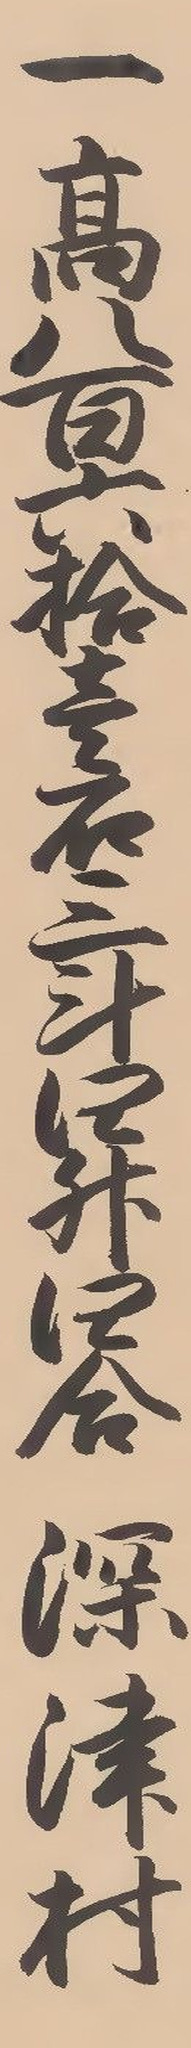一高八百六拾壱石三斗四升四合深津村
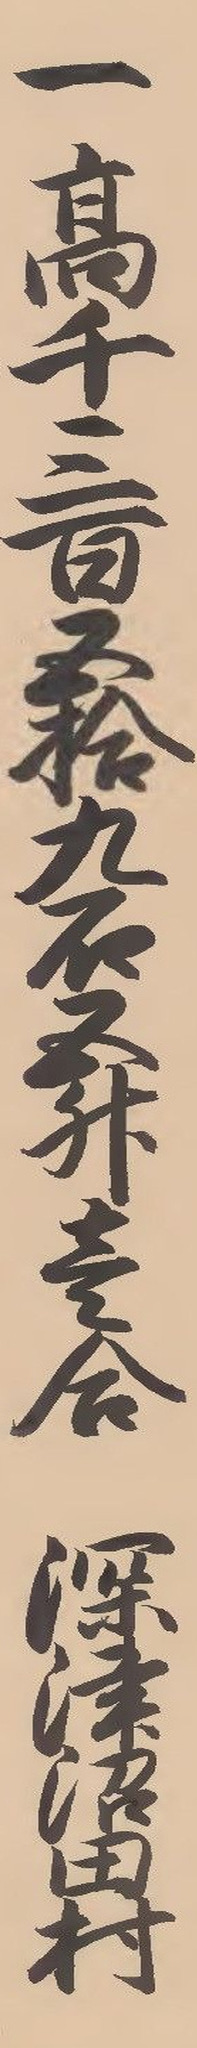一高千三百五拾九石五升壱合深津沼田村
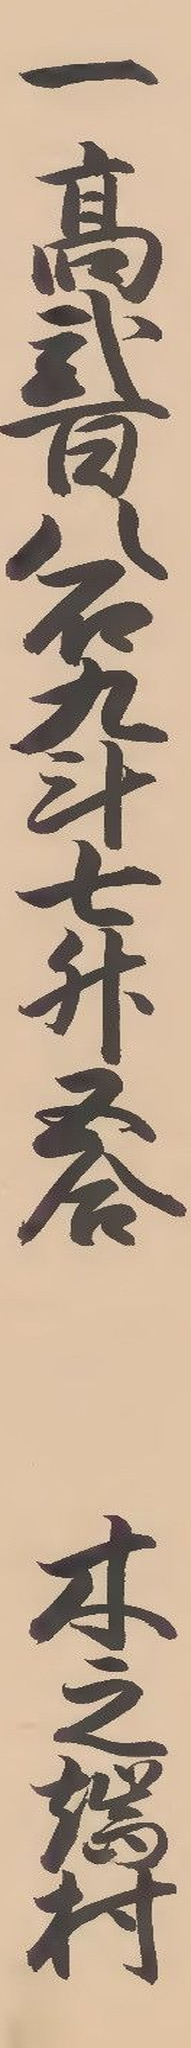一高弐百八石九斗七升五合木之端村

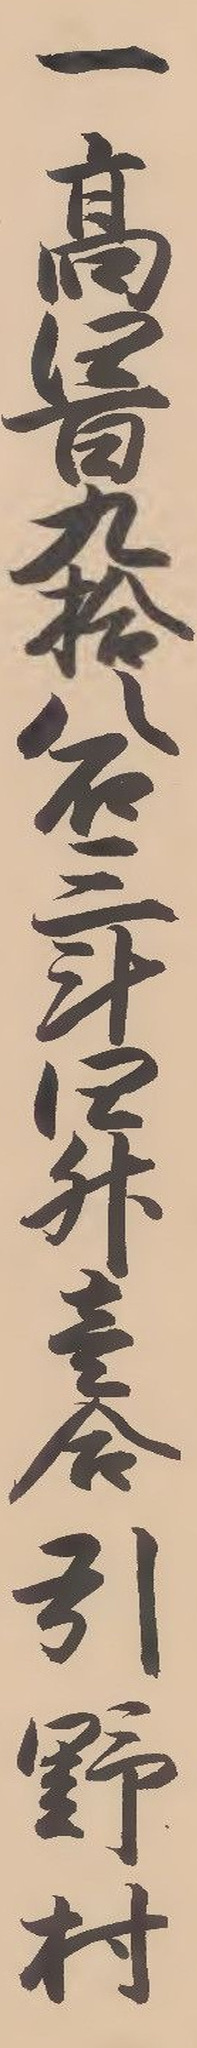一高四百九拾八石三斗四升壱合引野村
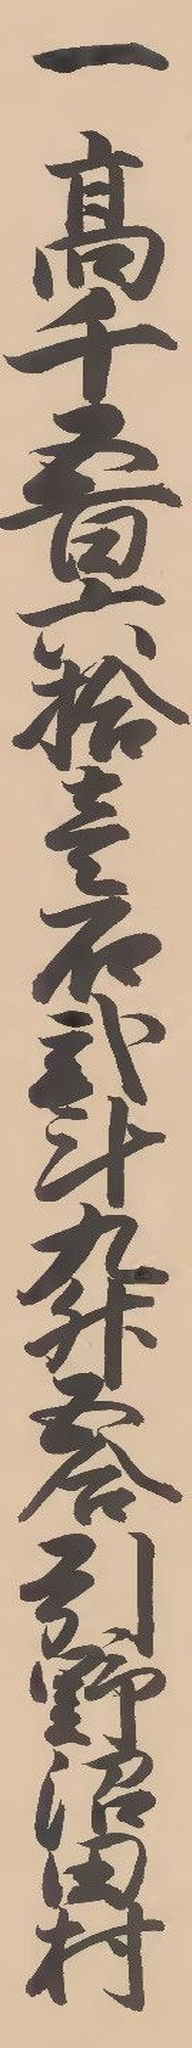一高千五百六拾壱石弐斗九升五合引野沼田村
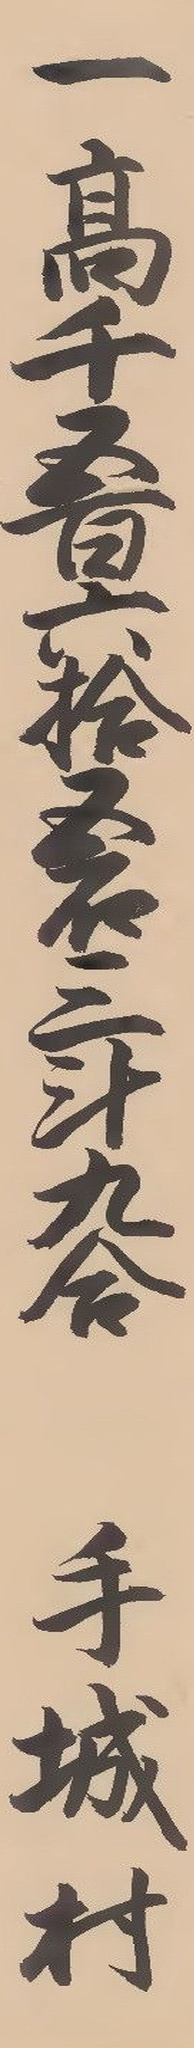一高千五百六拾五石三斗九合手城村
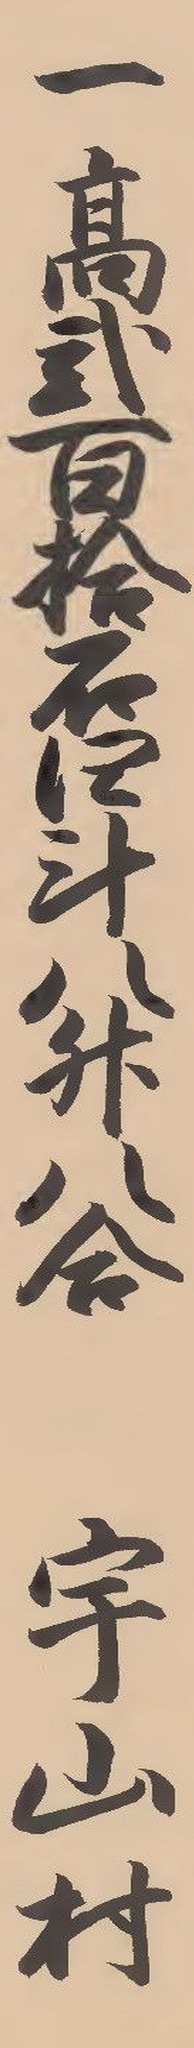一高弐百拾石四斗八升八合宇山村
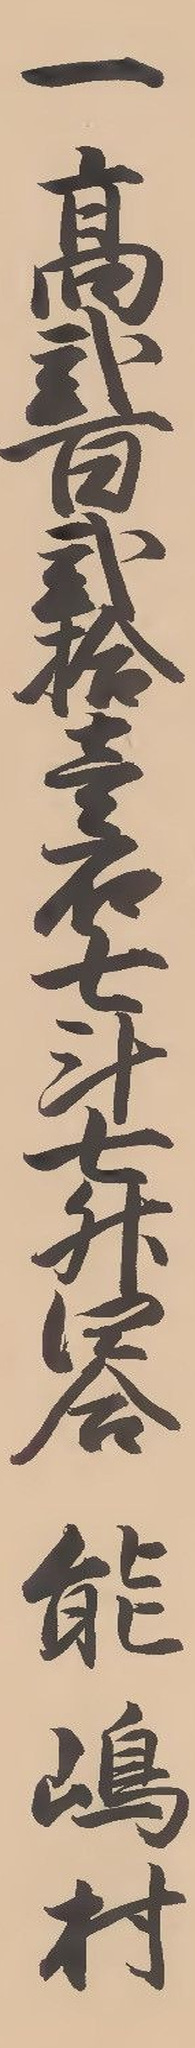一高弐百弐拾壱石七斗七升四合能島村
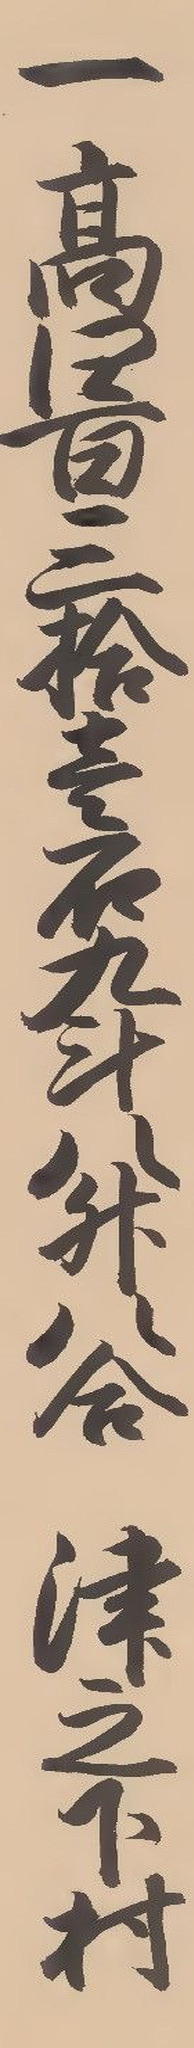一高四百三拾壱石九斗八升八合津之下村
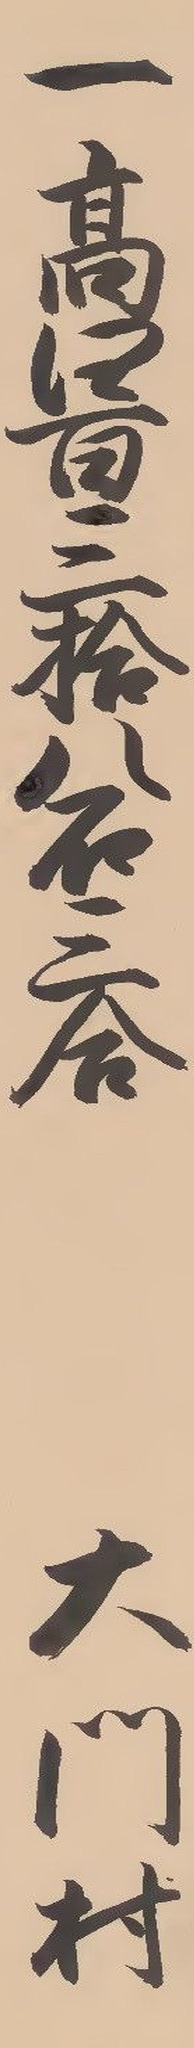一高四百三拾八石三合大門村
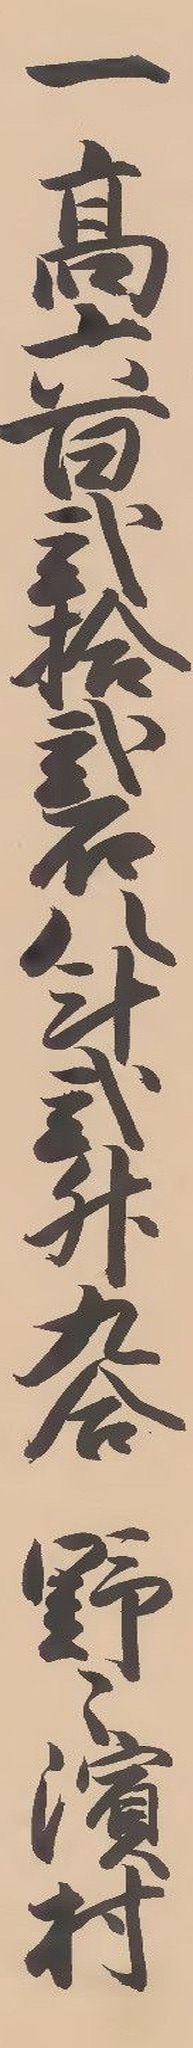一高六百弐拾弐石八斗弐升九合野々浜村

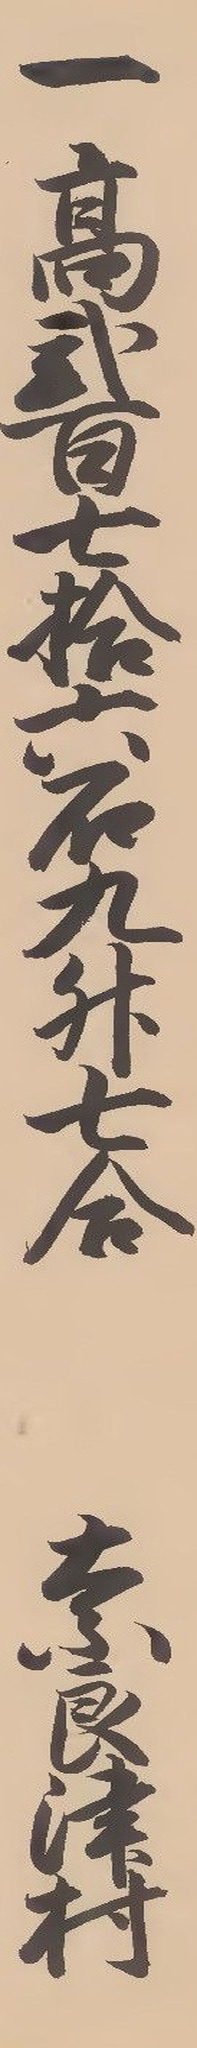一高弐百七拾六石九升七合奈良津村
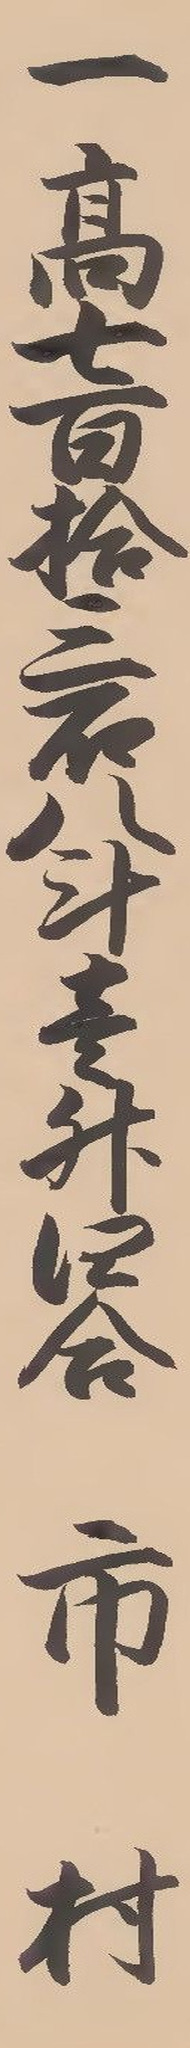一高七百拾三石八斗壱升四合市村
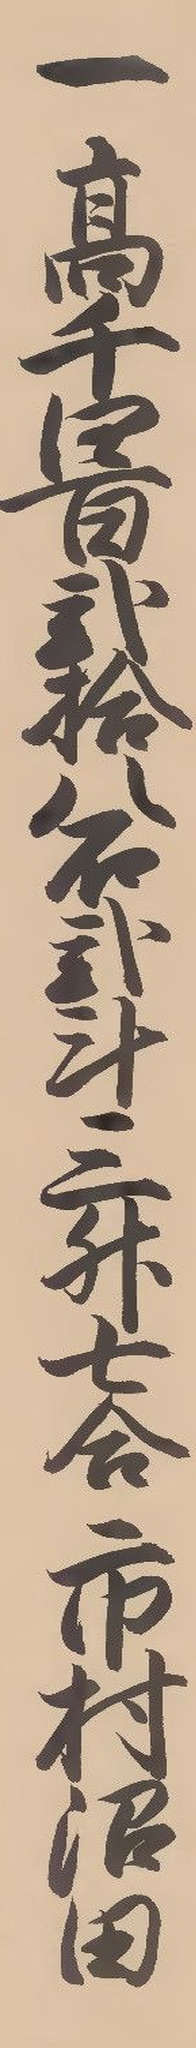一高千四百弐拾八石弐斗三升七合市村沼田
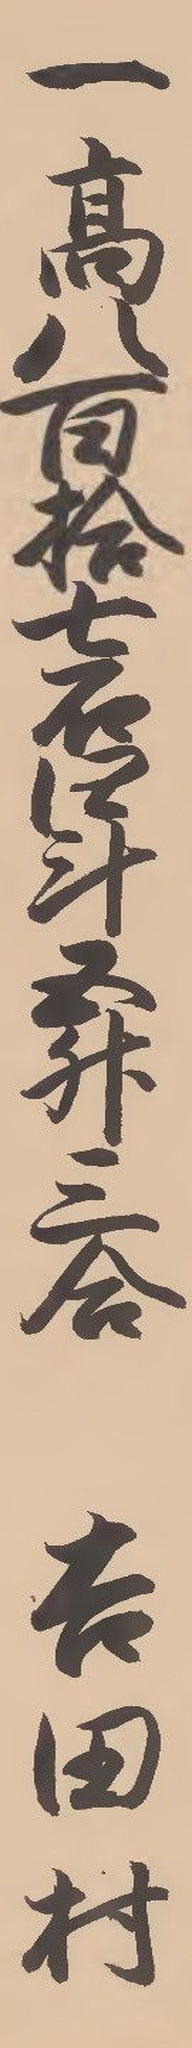一高八百拾七石四斗五升三合吉田村
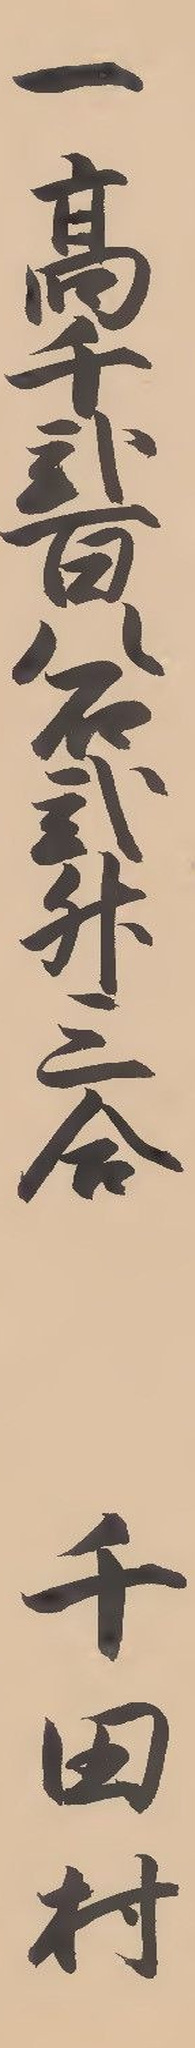一高千弐百八石弐升三合千田村
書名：備後国郷帳
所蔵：国立公文書館 National Archives of Japan
